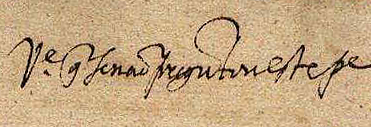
V.e q̄ se naõ pregūtou este pe
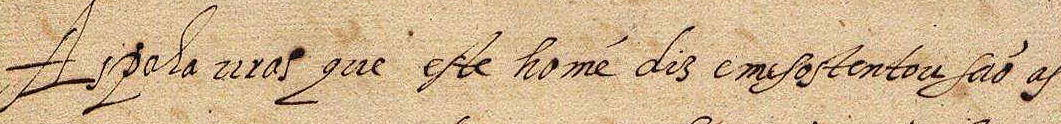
As palauras que este homē diz e me sostentou saõ as
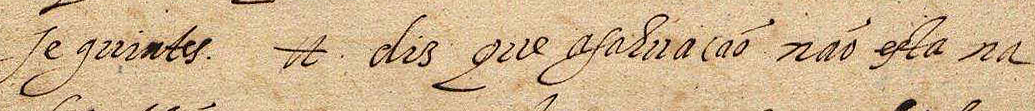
seguintes. item diz que a saluaçaõ naõ esta na
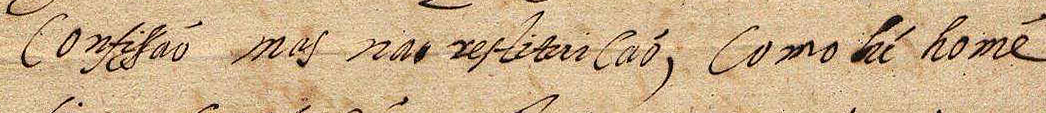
Confissaõ mas na restituiçaõ, como hū homē
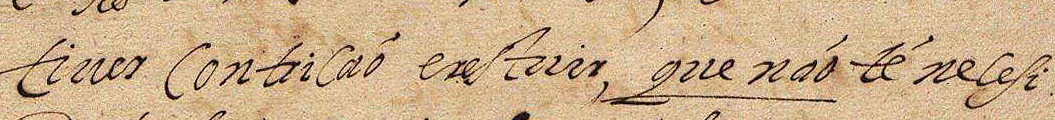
tiuer contriçaõ e restuir, que naõ tē necesi
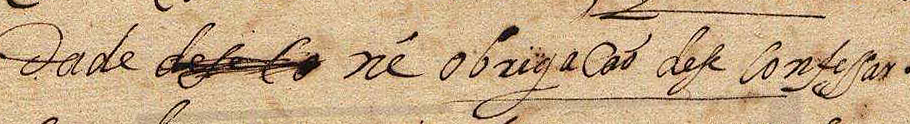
dade de se to nē obrigaçaõ de se confessar.
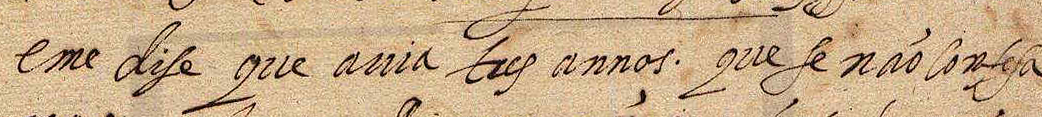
e me dise que auia tres annos. que se naõ confesa
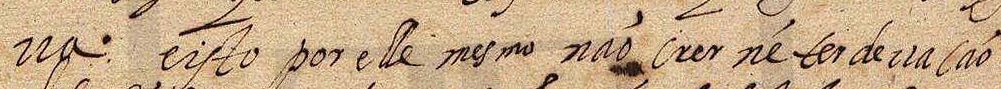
ua e isto por elle mesmo naõ crer nē ter deuaçaõ
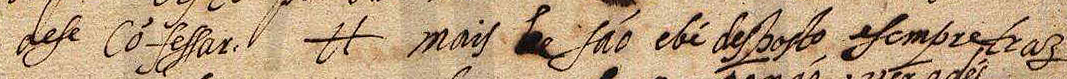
de se cōfessar. item mais he saõ e bē desposto, e sempre traz
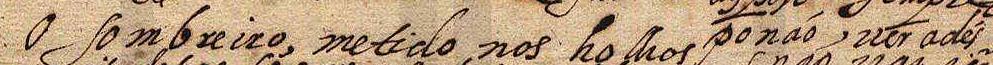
o sombreiro metido nos holhos po naõ uer a des̄
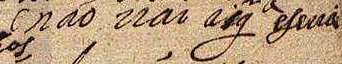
e não uai a igra e se uai
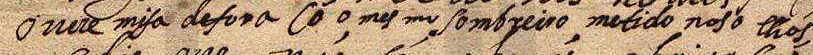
ouue misa de fora cō o mesmo sombreiro metido nos olhos
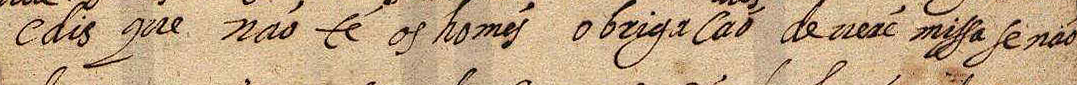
e dis que naõ tē os homes̄ obrigaçaõ de uerē missa senão
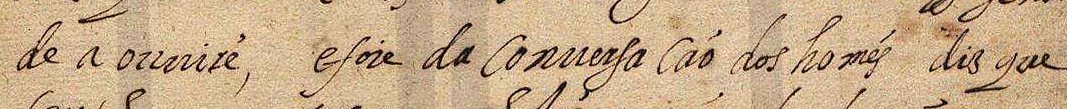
de a ouuirē, e foie da conuersaçaõ dos homēs diz que
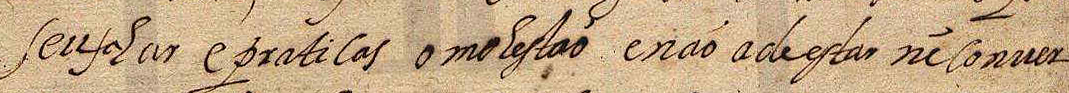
seu falar e praticas o molestaõ e naõ ade estar nē conuer
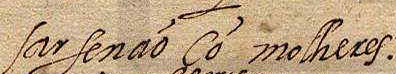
sar senão cō molheres.
